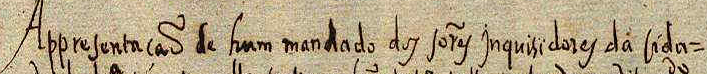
Appresentaçaõ de hum mandado dos sor̄es Jnquisidores da Cida
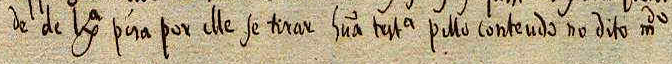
de de lxa pera por elle se tirar huā testa pello conteudo no dito mdo
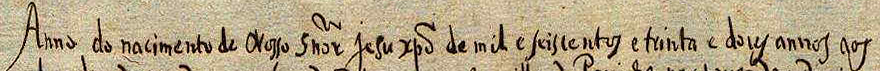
Anno do nacimento de Nosso snōr Jesu xpō de mil e seiscentos e trinta e dous annos aos
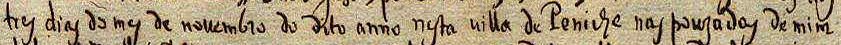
tres dias do mes de nouembro do dito anno nesta uilla de Peniche nas pouzadas de mim
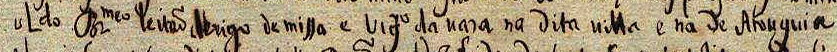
o Ldo Brmeo leitaõ clerigo de missa e vigro da uara na dita uilla e na de Atouguia
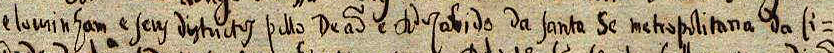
e lourinham e seus districtos pello Deaõ e Rdo Cabido da santa Se metropolitana da Ci
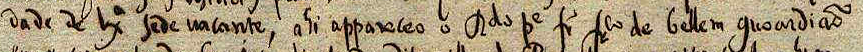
dade de Lxa sede uacante, ahi appareceo o Rdo pe fr̄ frco de bellem guoardiaõ
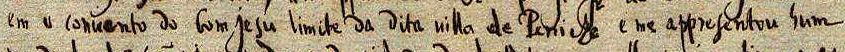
em o conuento do bom Jesu limite da dita uilla de Peniche e me appresentou hum
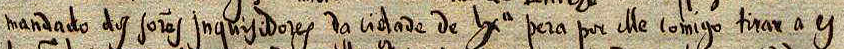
mandado dos sor̄es Jnquisidores da cidade de lxa pera por elle comigo tirar a es
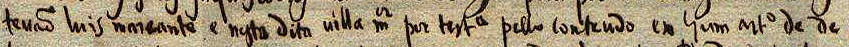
teuão luis mareante e nesta dita uilla mor por testa pello conteudo em hum arto de de
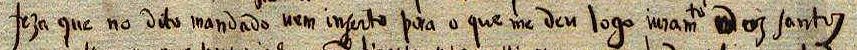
feza que no dito mandado uem inserto pera o que me deu logo iuramto dos santos
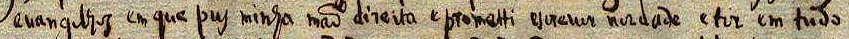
euangelhoz em que pus minha maõ direita e prometti escreuer uerdade e ter em tudo
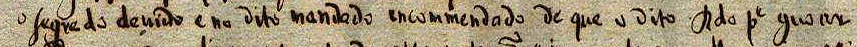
o segredo deuido e no dito mandado encommendado de que o dito Rdo pe guoar
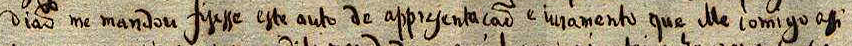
diaõ me mandou fizesse este auto de appresentaçaõ e iuramento que elle comigo assi
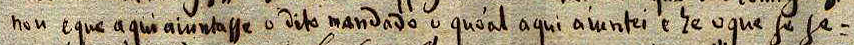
nou e que aqui aiuntasse o dito mandado o quoal aqui aiuntei e he o que se se
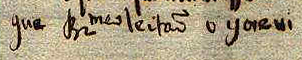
gue Brmeo leitaõ o escreui
